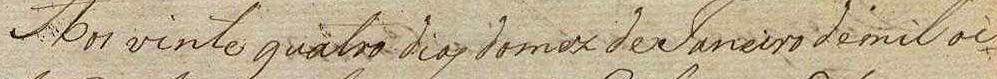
Aos vinte quatro dias do mez de Ianeiro de mil oi
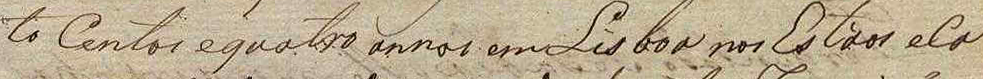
to Centos e quatro annos em Lisboa nos Estáos e Ca
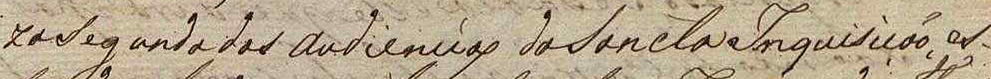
za segunda das audiencías da Sacta Inquisiçaõ, es
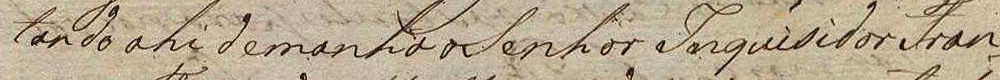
tando ahi de manhã o Senhor Inquisidor Fran
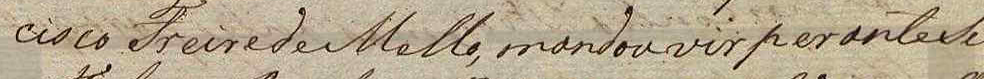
cisco Freire de Mello, mandou vir perante si
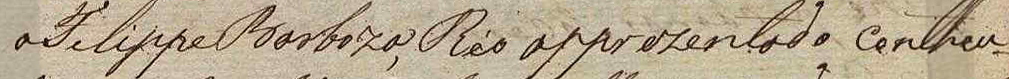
a Felippe Barboza, Réo apprezentado contheu
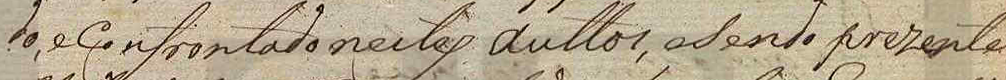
do, e confrontado nestes auttos, e sendo prezente
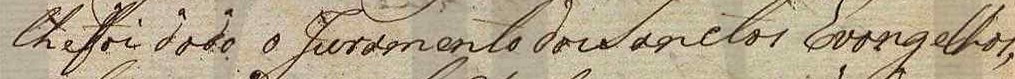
lhe foi dado o Juramento dos Sanctos Evangelhos,
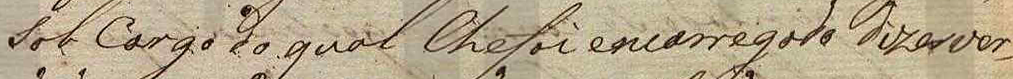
sob cargo do qual lhe foi encarregado dizer ver
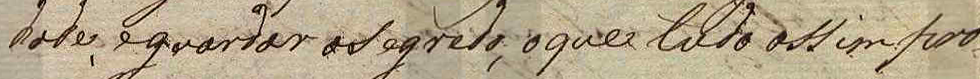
dade, e guardar o segredo, o que tudo assim pro
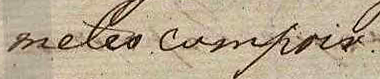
meteo cumprir.
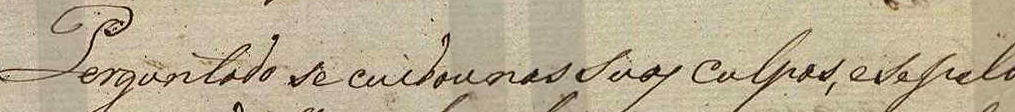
Perguntado se cuidou nas suas culpas, e se pelo
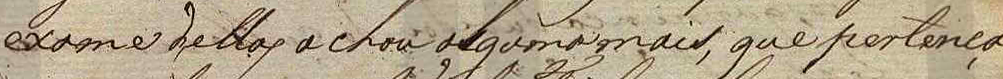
exame dellas achou alguma mais, que pertença
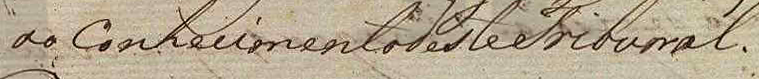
ao conhecimento deste Tribunal.
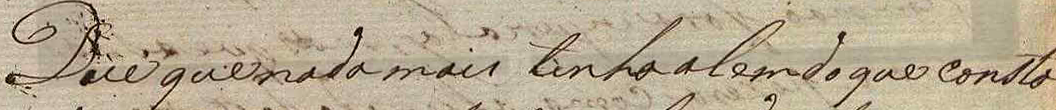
Dice que nada mais tinha alem do que consta
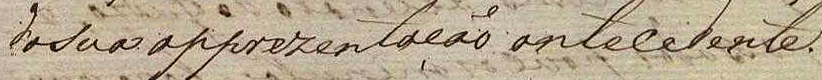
da sua apprezentaçaõ antecedente.
